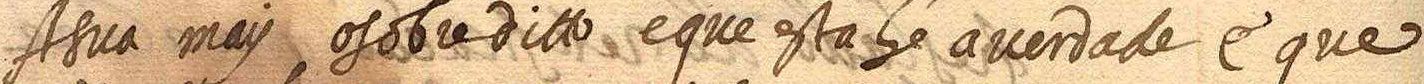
A sua may o sobreditto e que esta he a uerdade e que
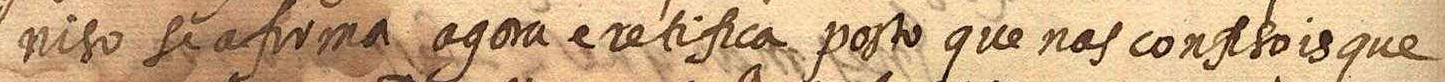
niso se afirma agora e retifica posto que nas confissois que
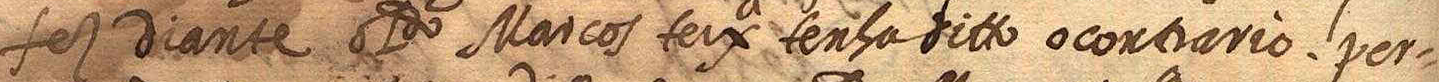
fez diante o Ldo Marcos teixa tenha ditto o contrario per
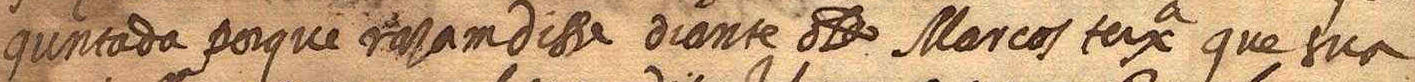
guntada porque razam disse diante o Ldo Marcos teixa que sua
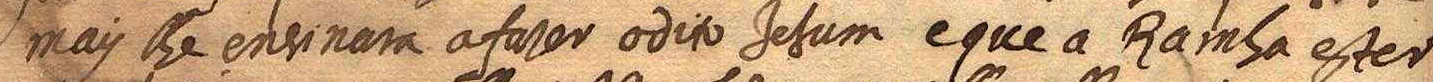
may lhe ensinara a fazer o dito Jejum e que a Rainha ester
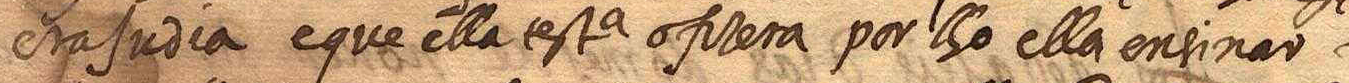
era Judia e que ella testa o fizera por lho ella ensinar
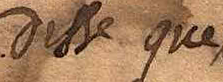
disse que
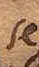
se
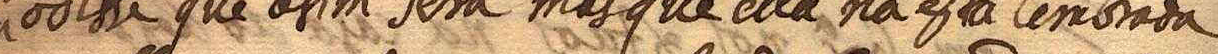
o disse que asim sera mas que ella nā esta lembrada
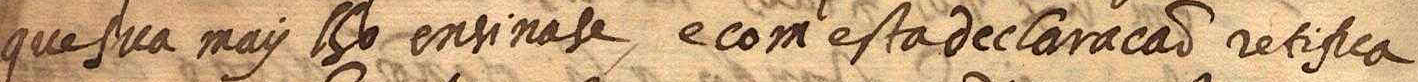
que sua may lho ensinase e com esta declaração retifica
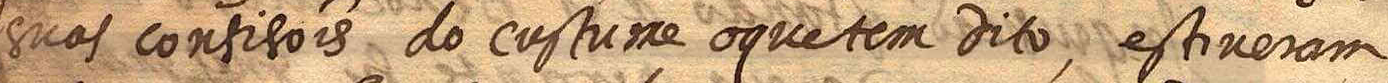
suas confisoĩs do custume o que tem dito, estiueram
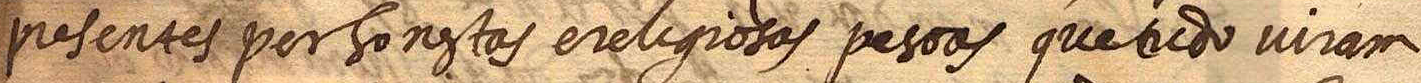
presentes per honestas e religiosas pesoas que tudo uiram
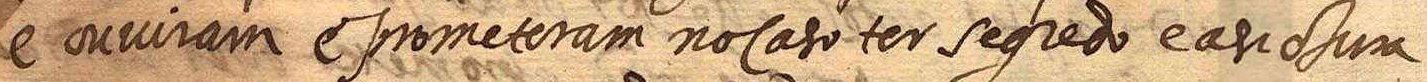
e ouuiram e prometeram no Caso ter segredo e asi o Jura
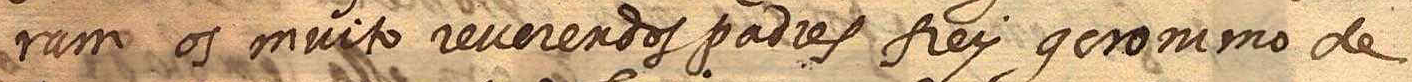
ram os muito reuerendos padres frey geronimo de
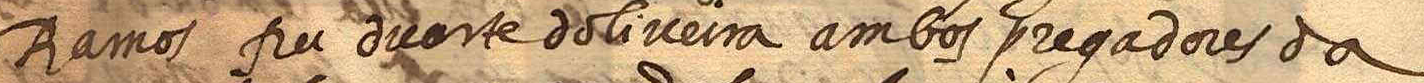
Ramos frei duarte doliueira ambos pregadores da
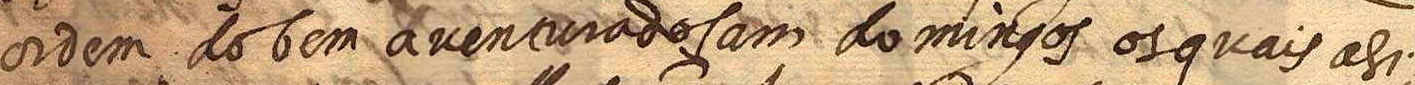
ordem do bem auenturado sam domingos os quais asi
